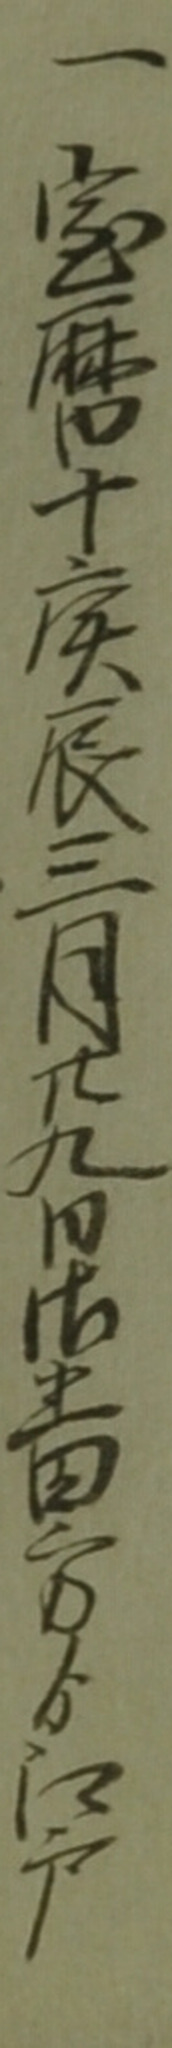一宝暦十庚辰三月廿九日御番方ゟ江戸
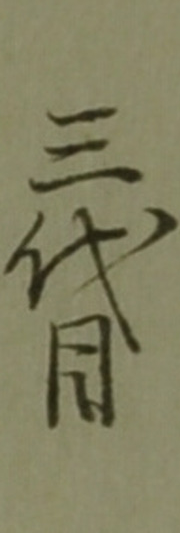三代目
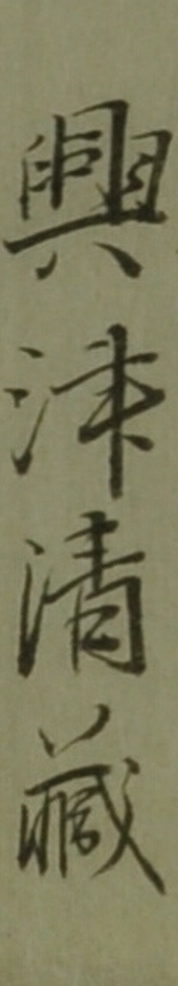興津清蔵
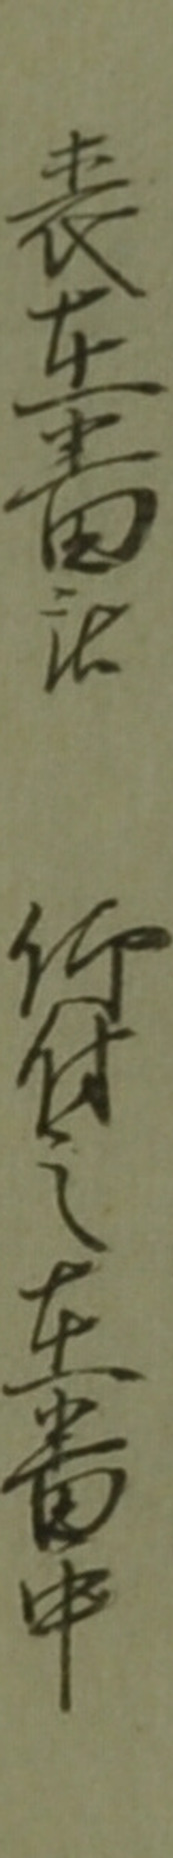表在番被仰付之在番中
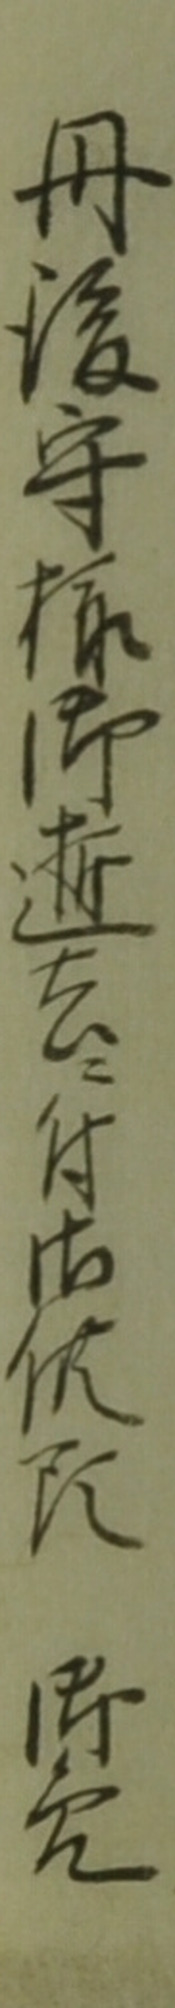丹後守様御逝去ニ付御供頭御免
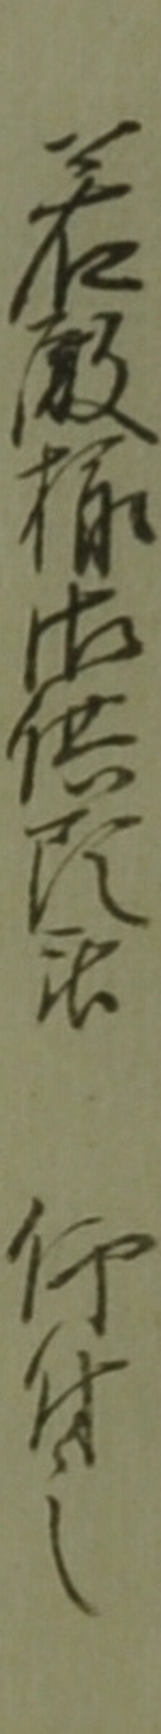若殿様御供頭被仰付之

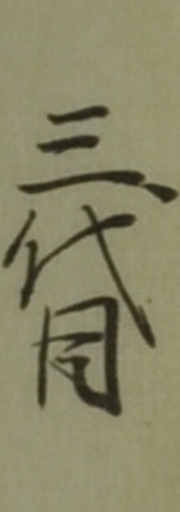三代目
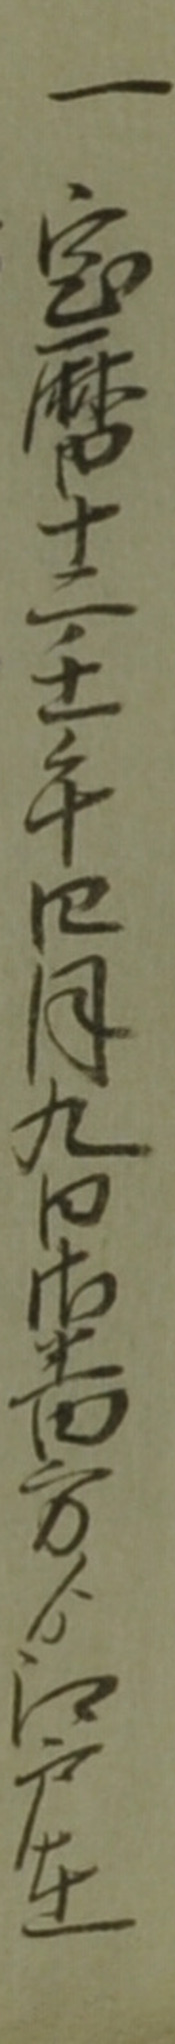一宝暦十二壬午四月九日御番方ゟ江戸在
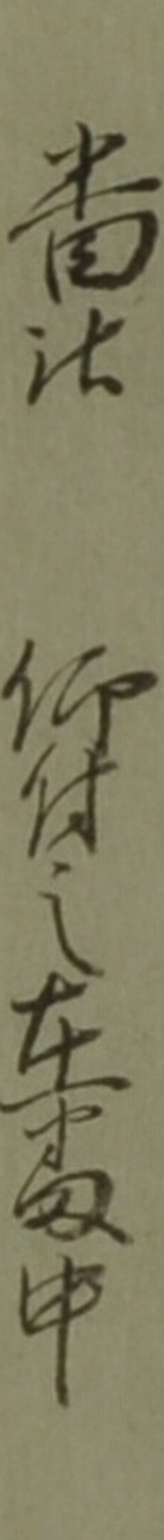番被仰付之在番中
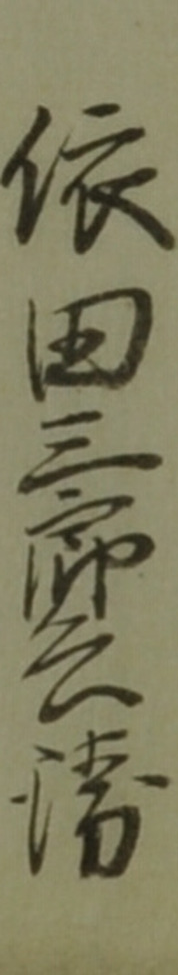依田三郎兵衛
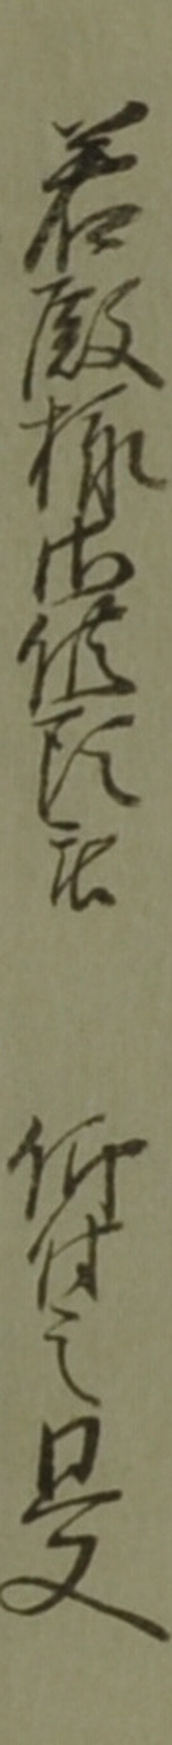若殿様御供頭被仰付之且又
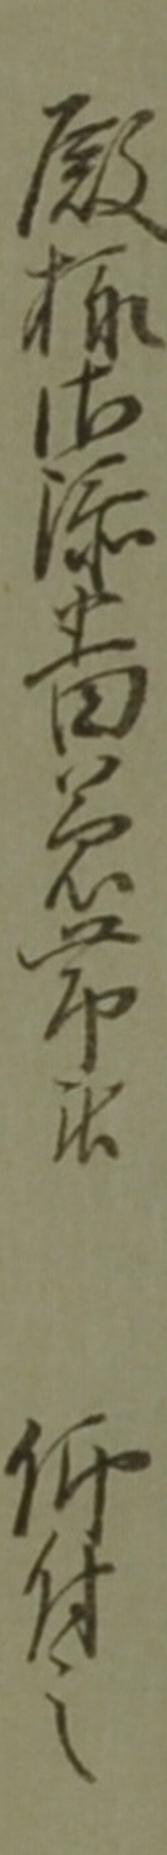殿様御添番兼帯被仰付之
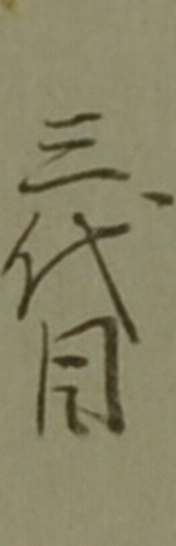三代目
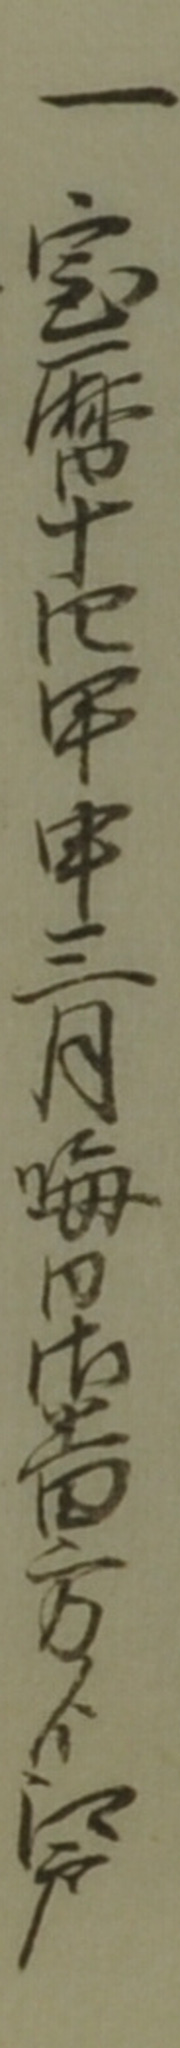一宝暦十四甲申三月晦日御番方ゟ江戸
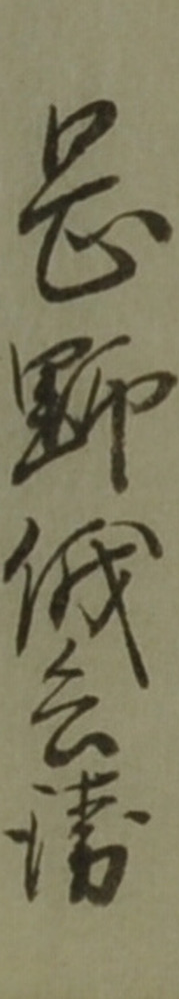岡野儀兵衛
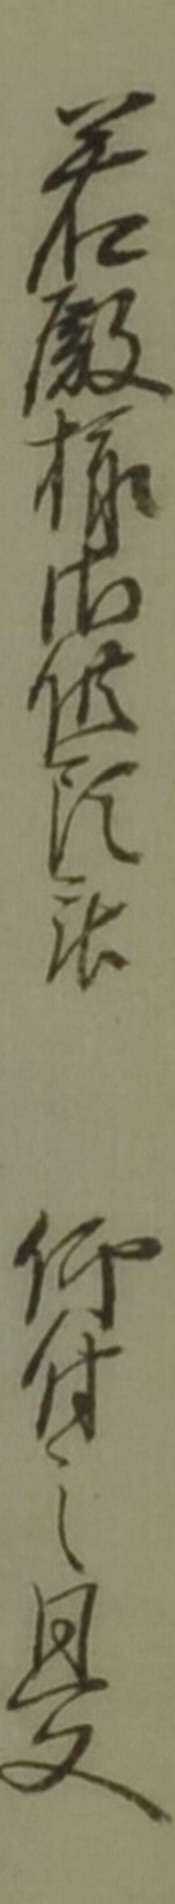若殿様御供頭被仰付之且又
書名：諸御役代々録（六）
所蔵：伊那市立高遠町図書館・合同会社AMANE
